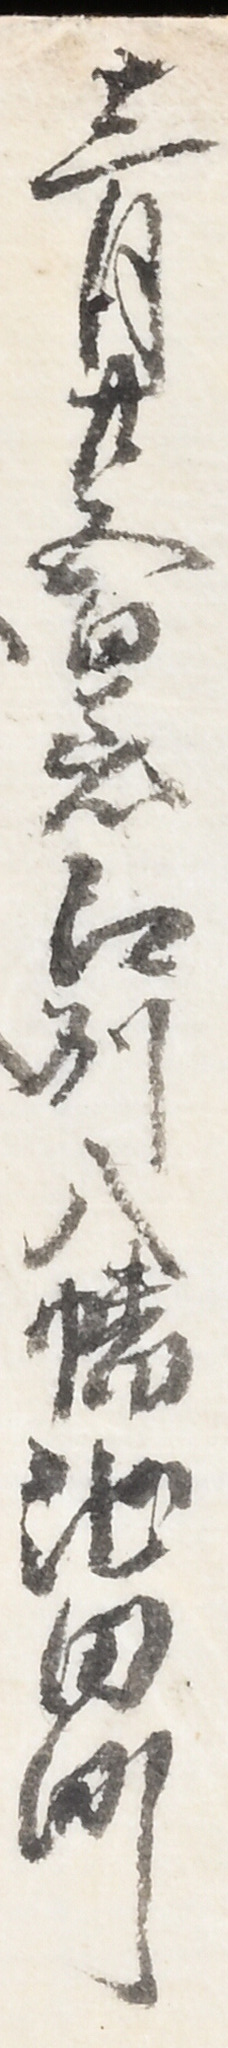十二月廿五日着江州八幡池田町
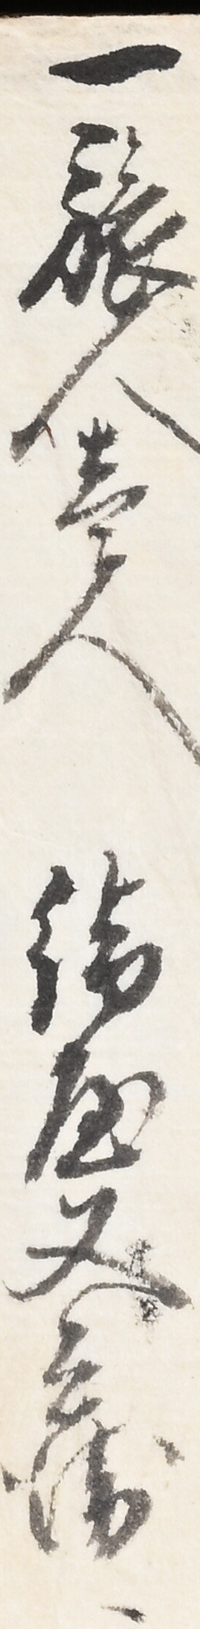一旅人壱人絹屋又兵衛・
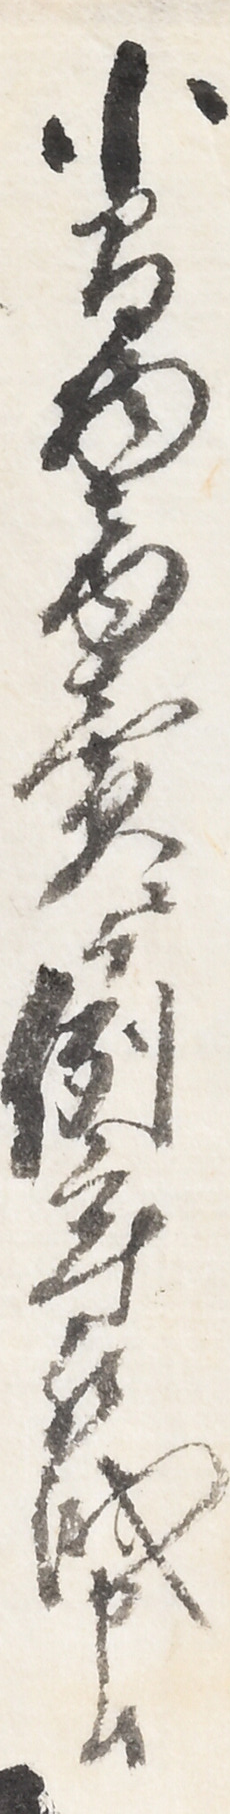小間物商売ニ而例年罷越申候
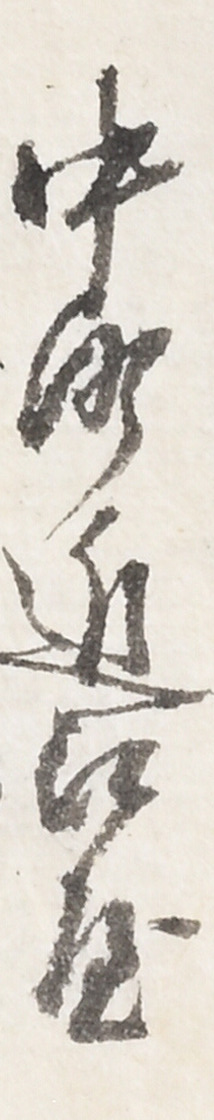中町近江屋
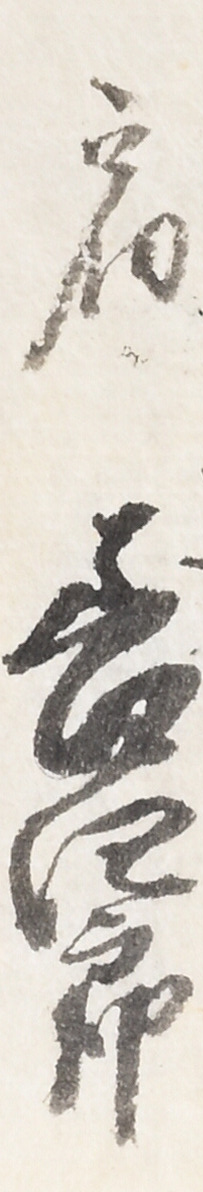宿善四郎
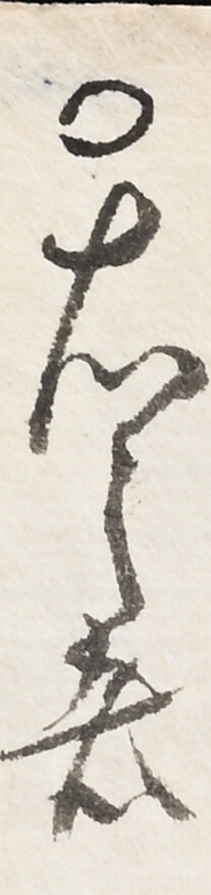〇右之者
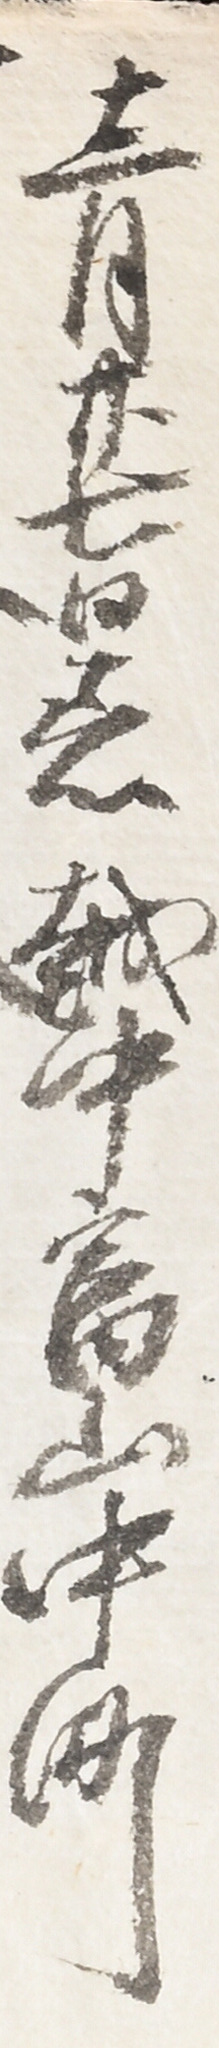十二月廿七日着越中富山中町
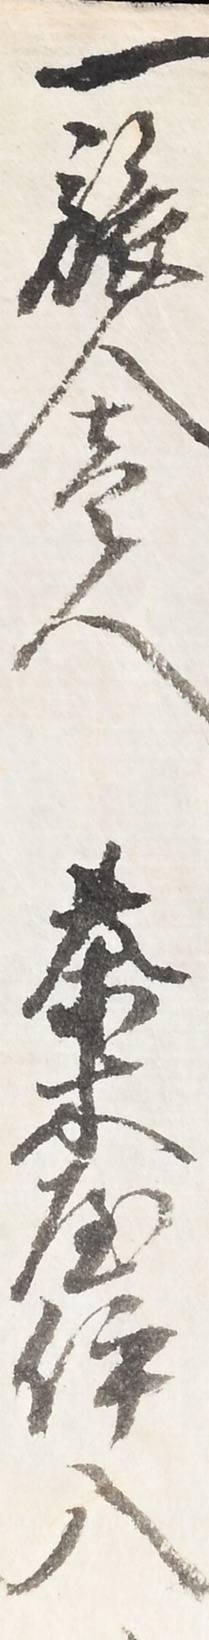一旅人壱人茶木屋伊八
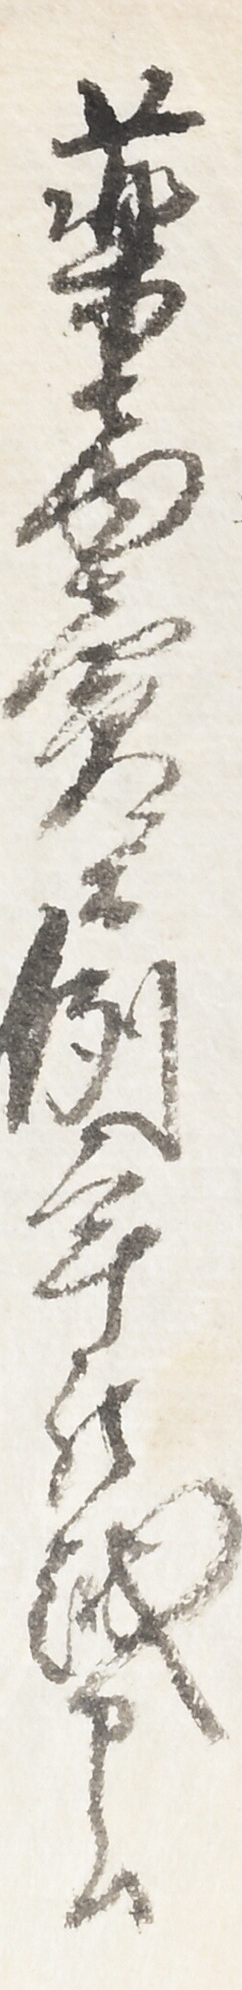薬商売ニ而例年罷越申候
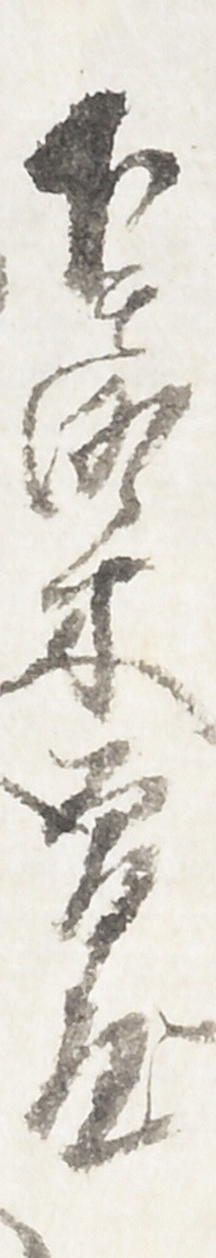下モ町木曽屋
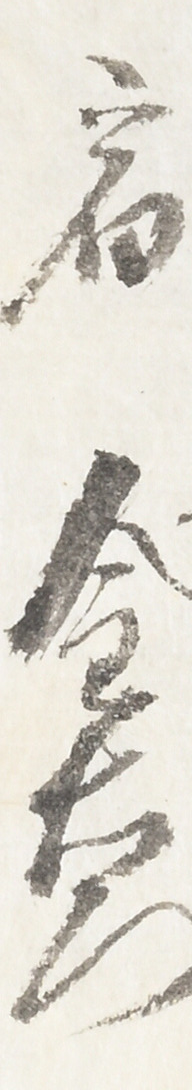宿金右衛門
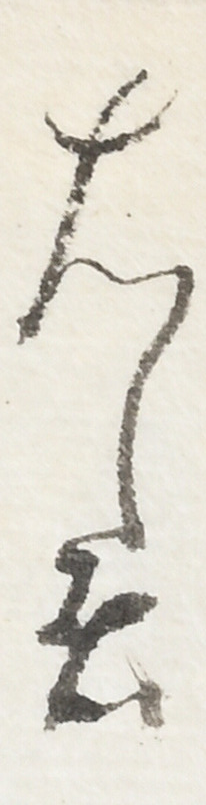右之者
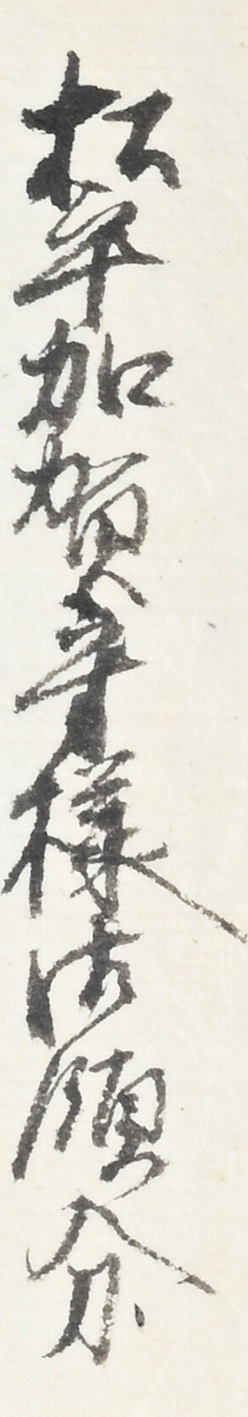松平加賀守様御領分
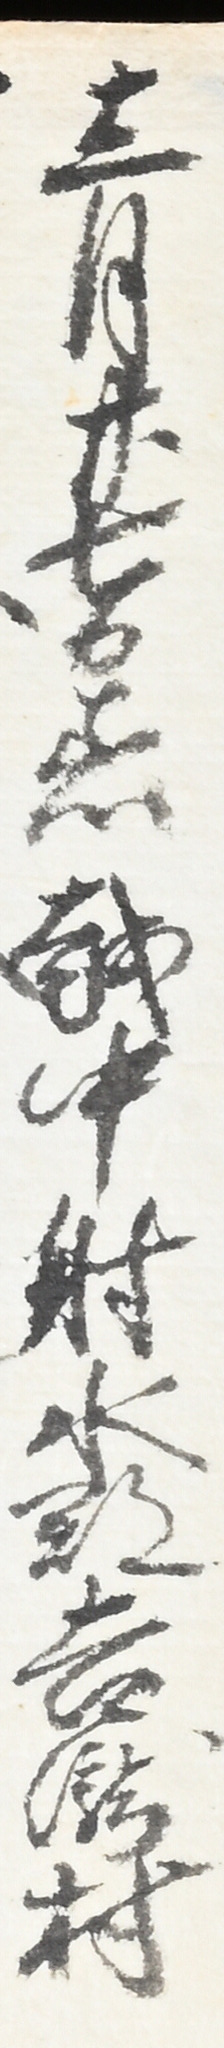十二月廿七日着越中射水郡吉滝村
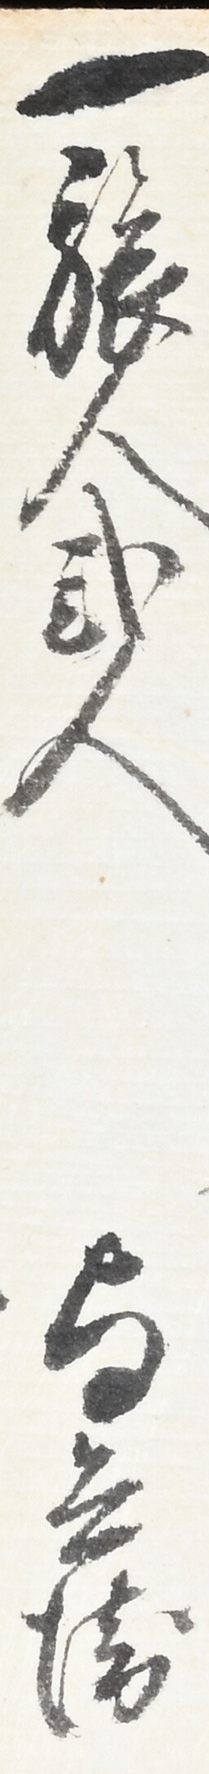一旅人弐人与兵衛
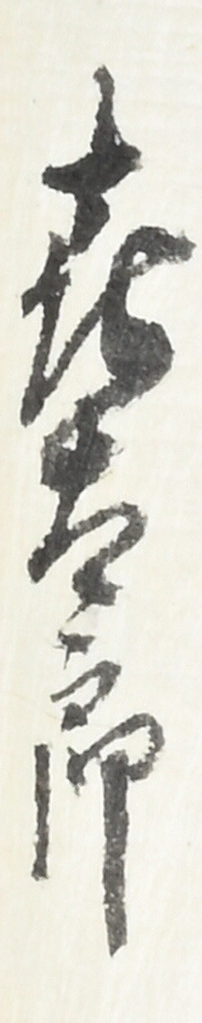喜太郎
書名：旅人泊控帳
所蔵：伊那市立高遠町図書館・合同会社AMANE
